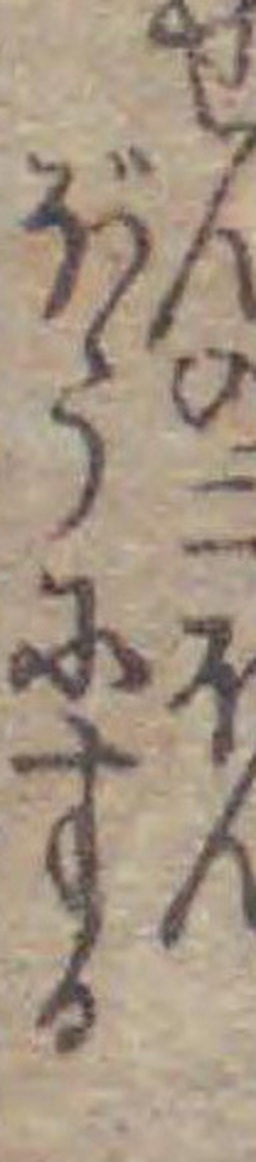ぼうにする

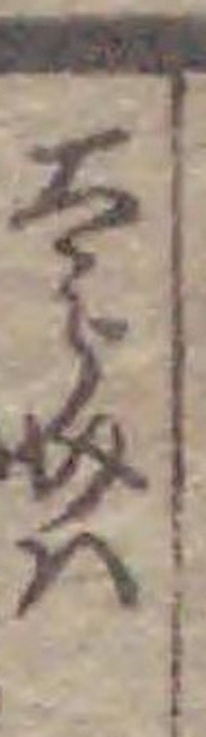太郎介は
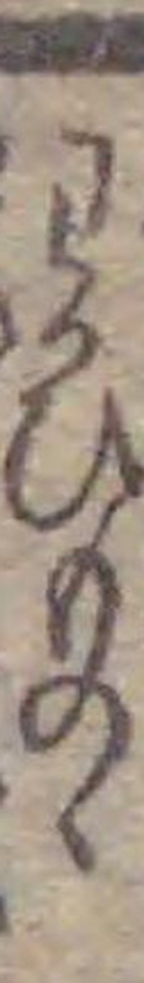わかひものゝ
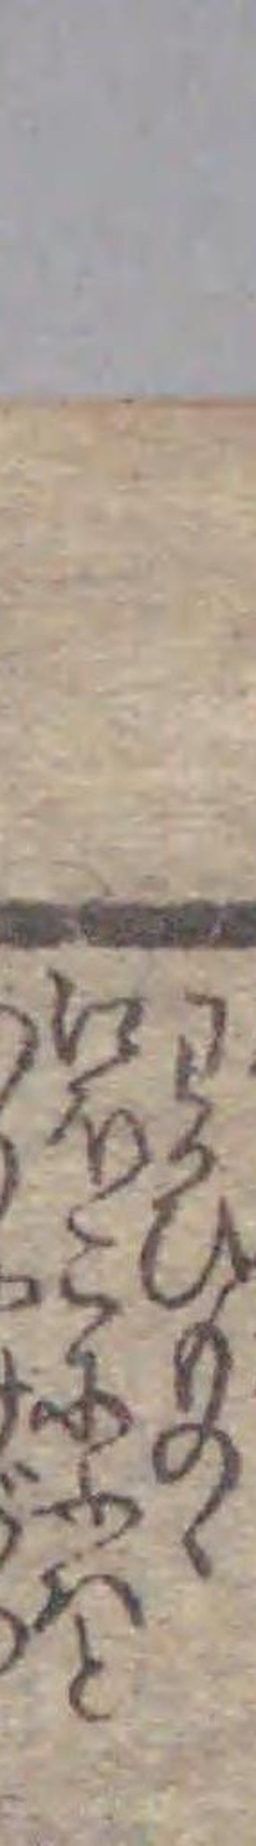口ほこにふはと
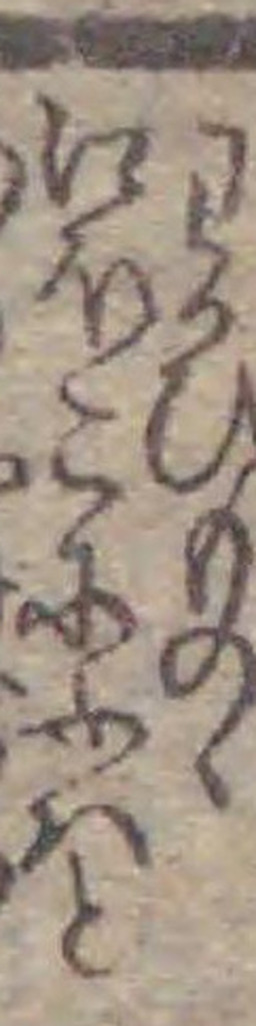口ほこにふはと
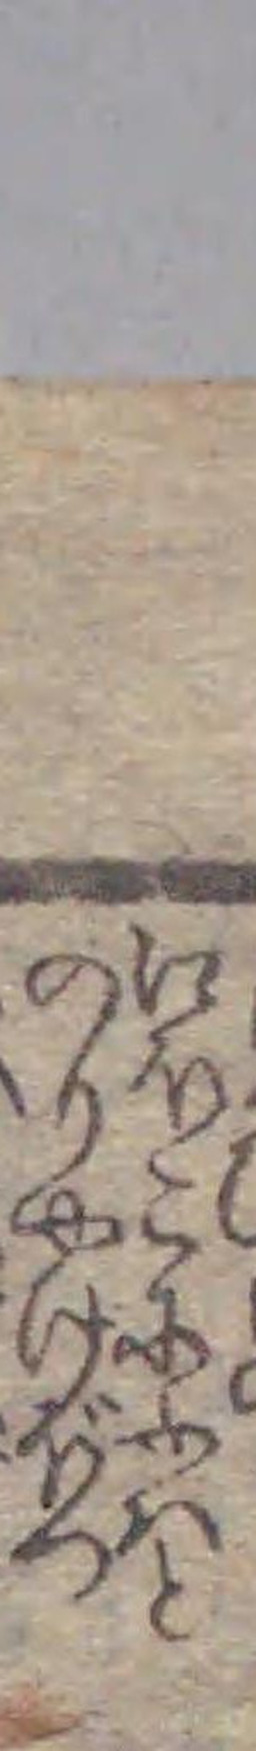のりやけぼつ
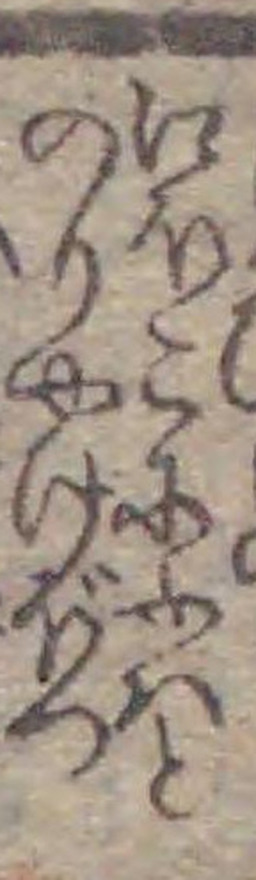のりやけぼつ
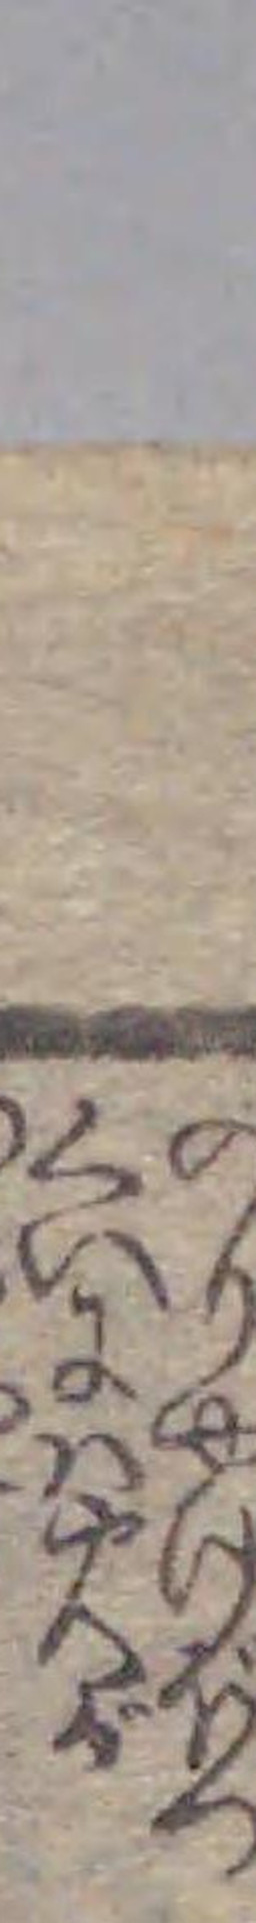くいには火が
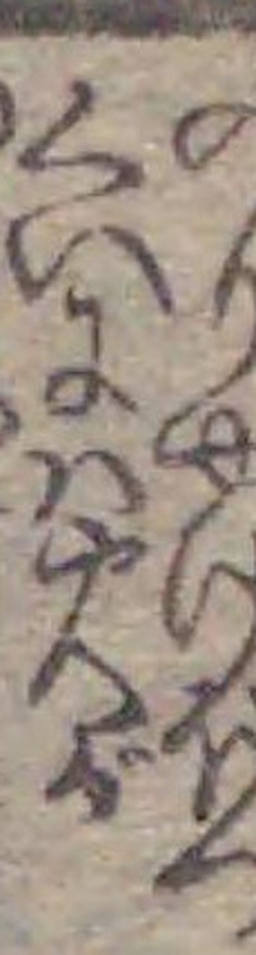くいには火が
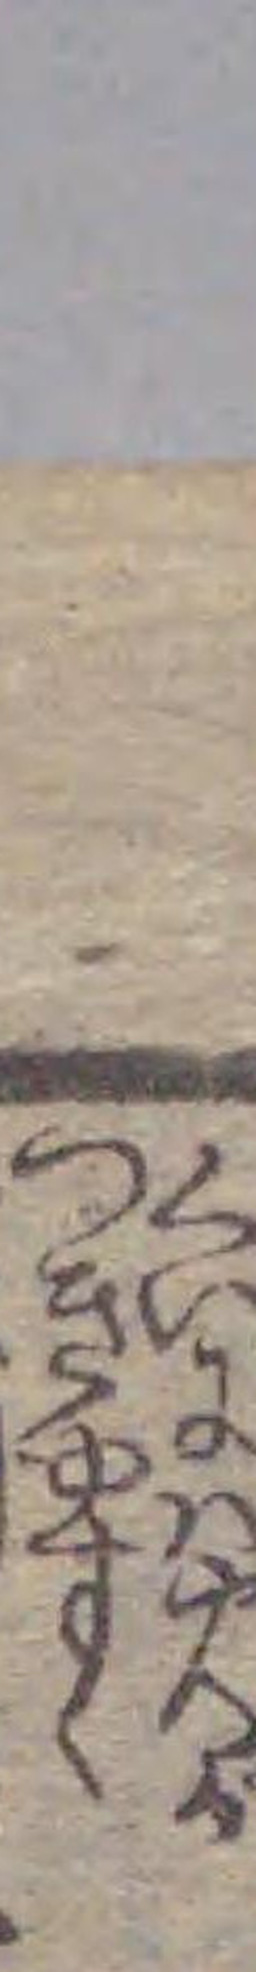つきやすく
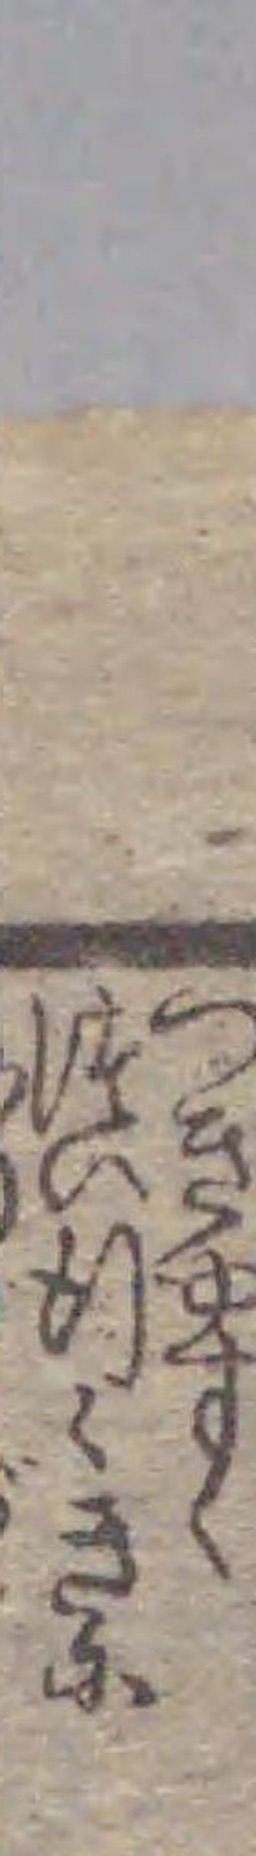つい行くきに
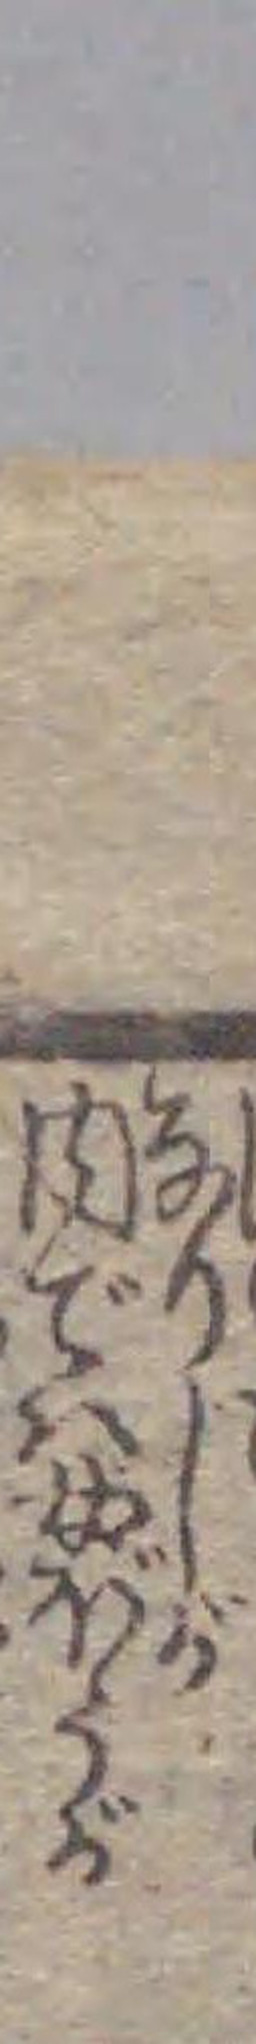内では女ぼうが
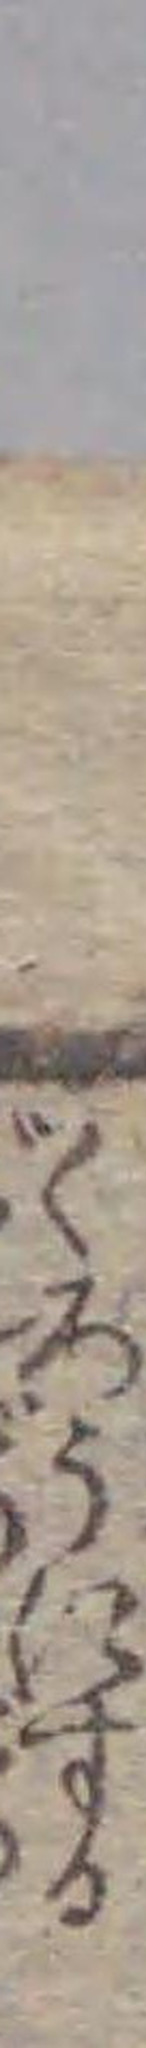くろうにする
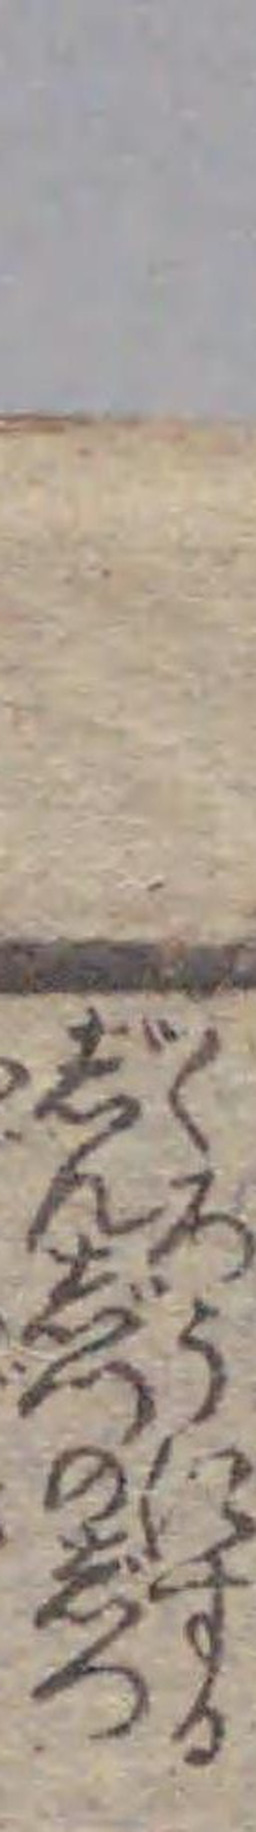じんじつのじつ
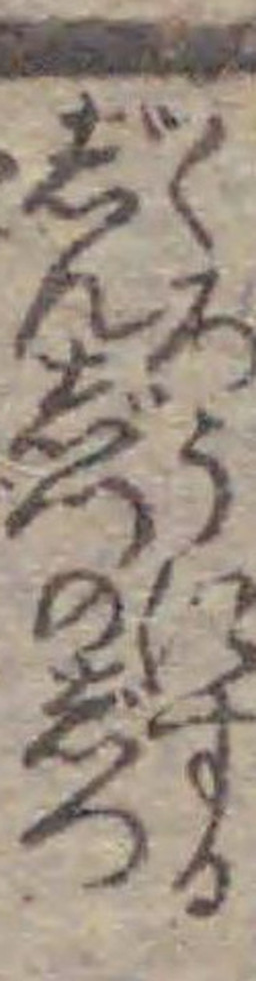じんじつのじつ
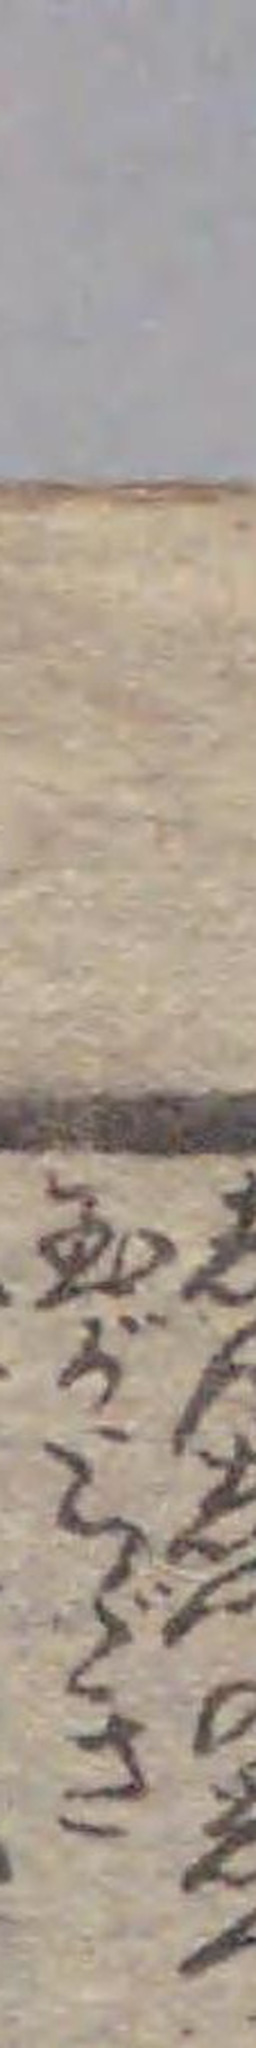玉がとゞき
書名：四遍搨心学草帋 : 3巻
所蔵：国立国会図書館 National Diet Library, JAPAN
